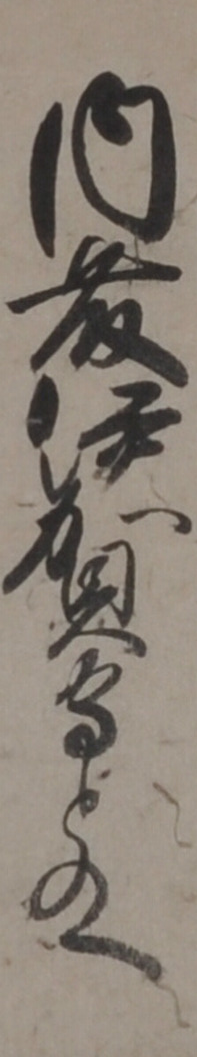内藤伊賀守どのへ

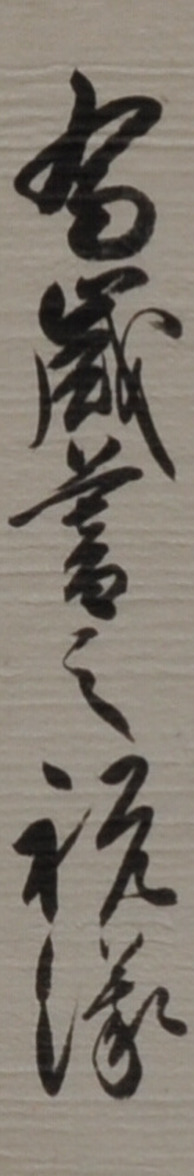為歳暮之祝儀
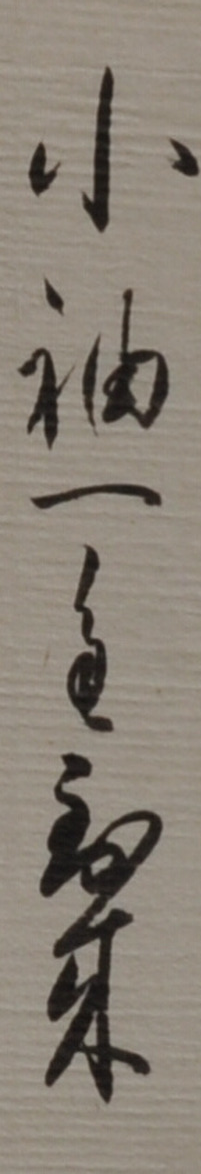小袖一重到来
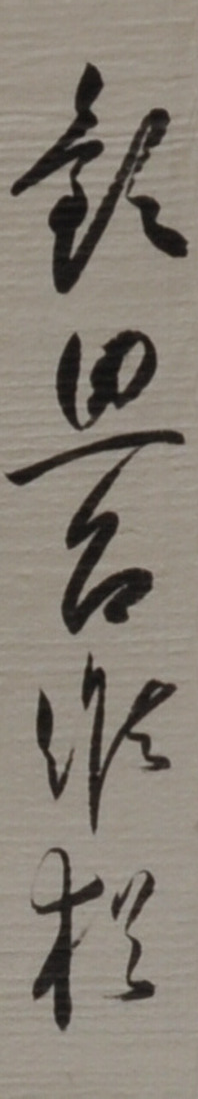歓思召候猶
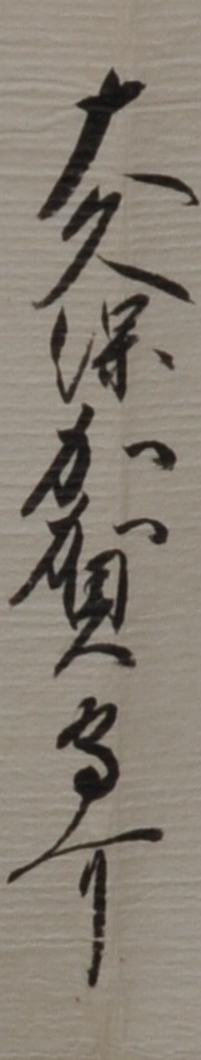大久保加賀守可
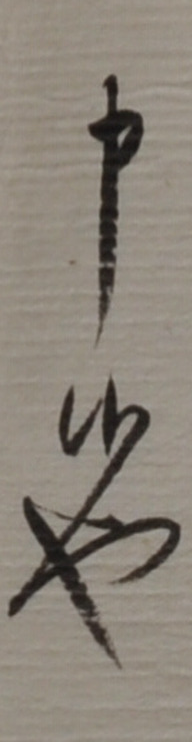申候也
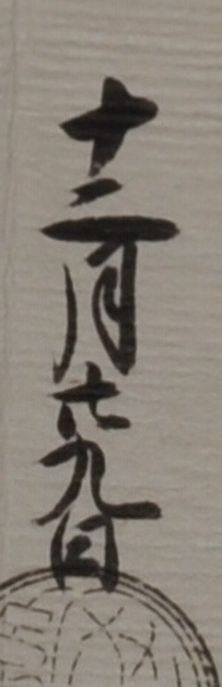十二月廿九日
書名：御内書
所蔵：伊那市立高遠町図書館・合同会社AMANE
